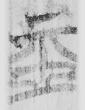亞
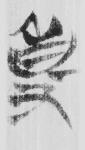事
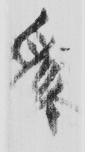奚
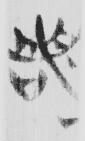若
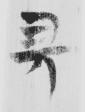𡵂
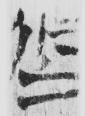{辶殳}
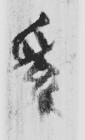奚
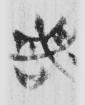若
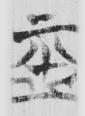亞
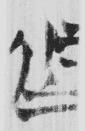{辶殳}
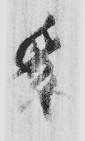奚
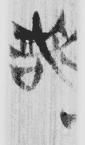若
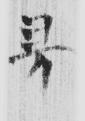𡵂
